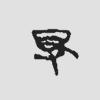𠭁
